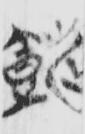鼗
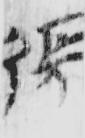張
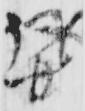恘
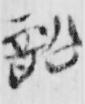訟
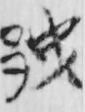○（鄢）
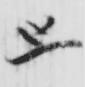之
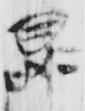鳴
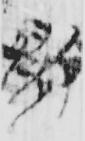○（狐）
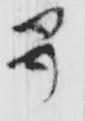邑
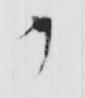人
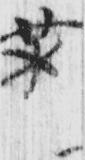某
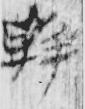與
